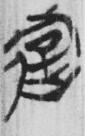遊
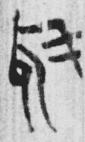於
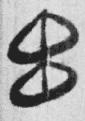玄
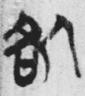咎（丘）
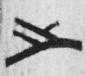之
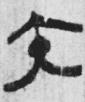內（汭）
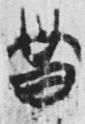冬
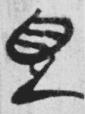見
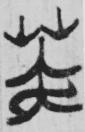芺
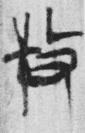攼（薊）
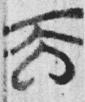而
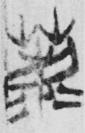薦
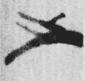之
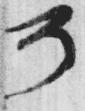乃
